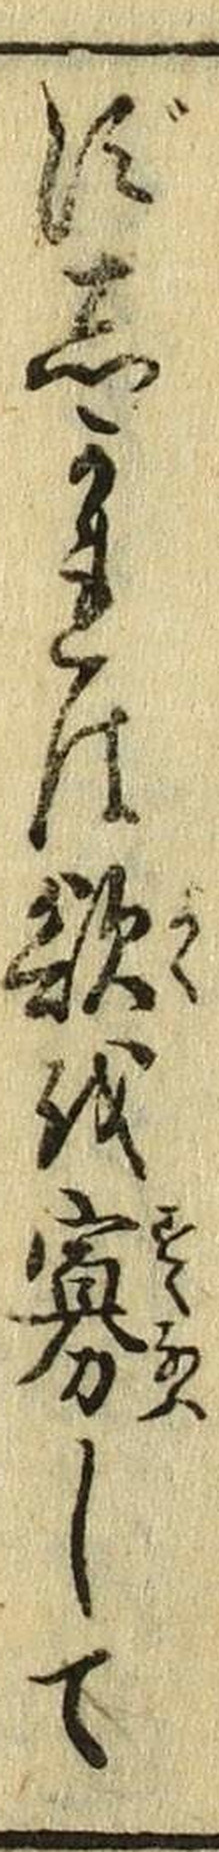ずしかれは欲を寡して
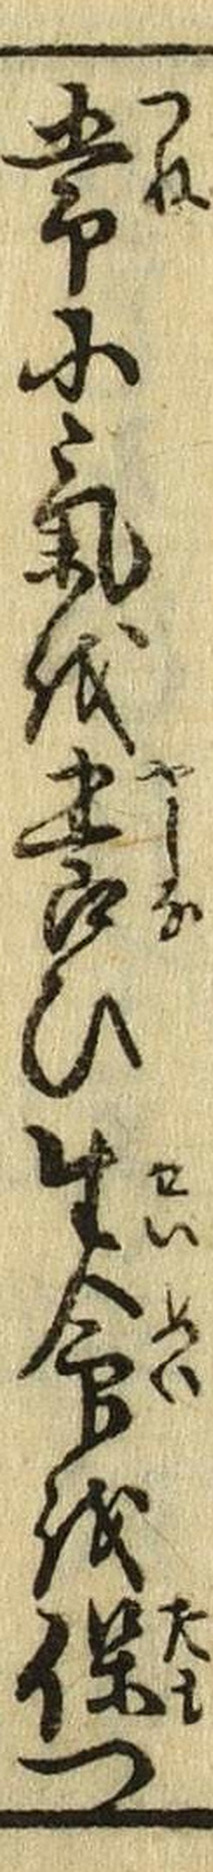常に気を養ひ生命を保つ
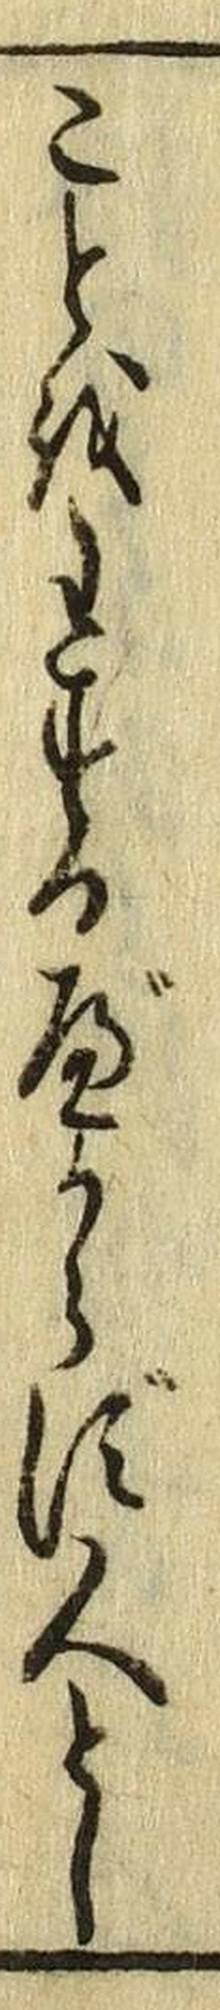ことをわするべからず人とし
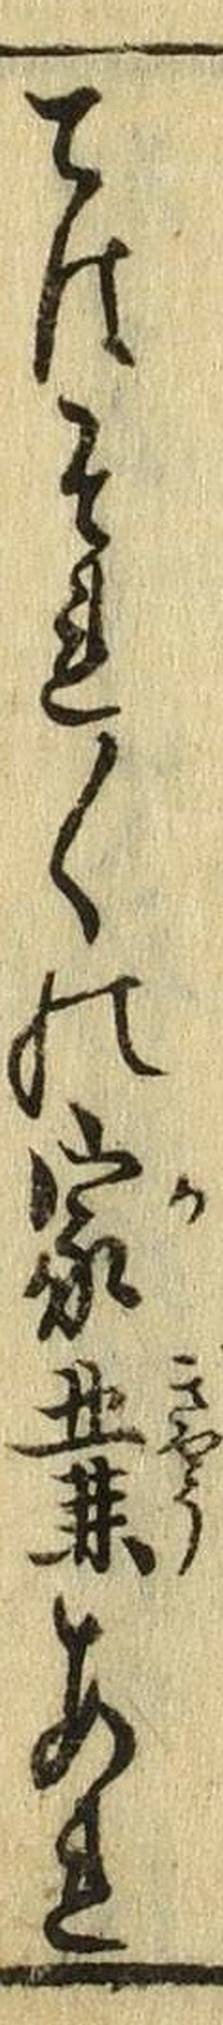てはそれ〳〵の家業あれ
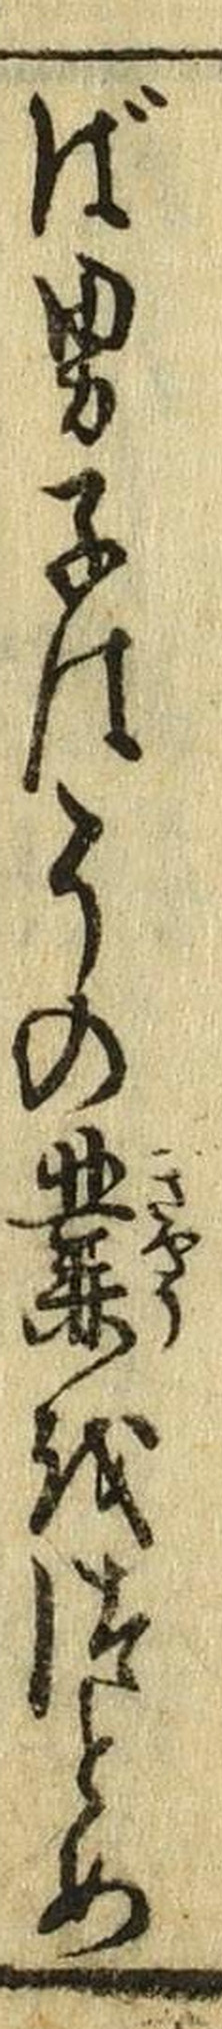ば男子はその業をつとめ
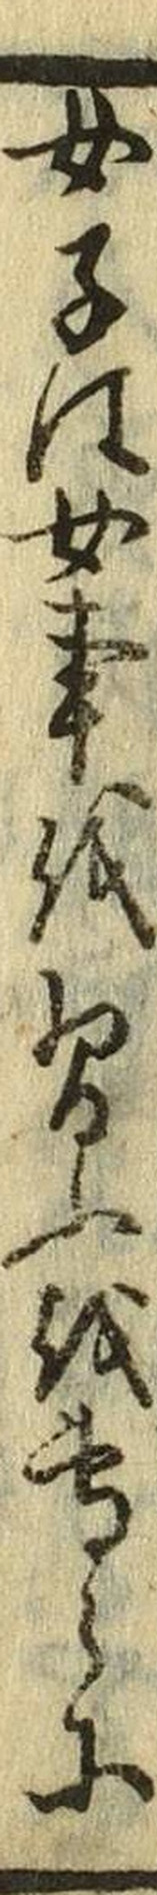女子は女事を習ふを専らに
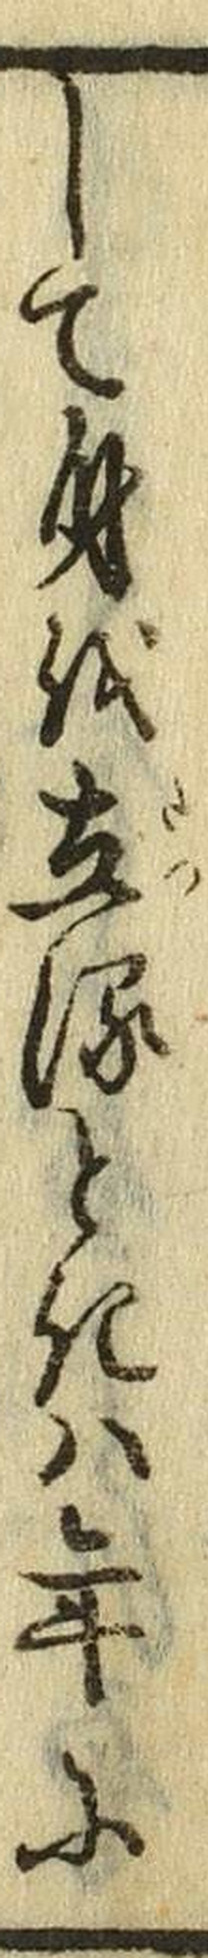して身を立るときは年に
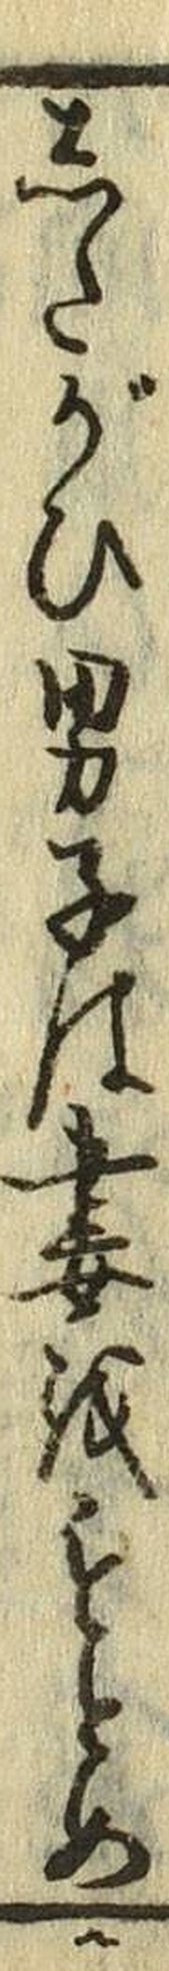したがひ男子は妻をもとめ
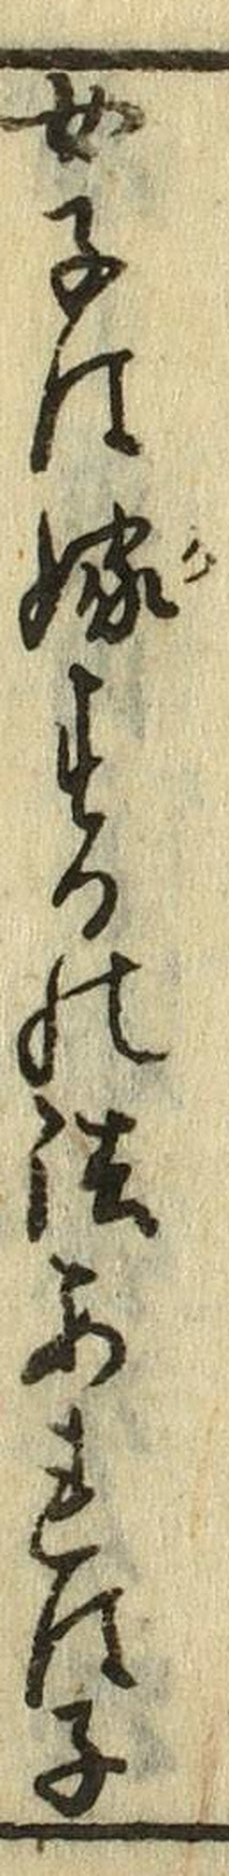女子は嫁するの法あれは子
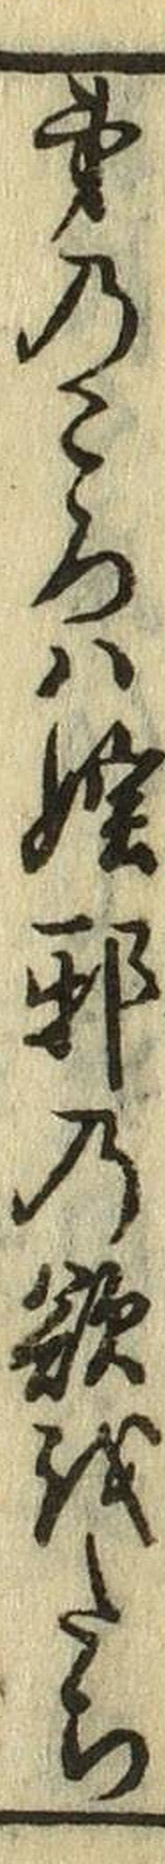弟のころは婬邪の欲をたち
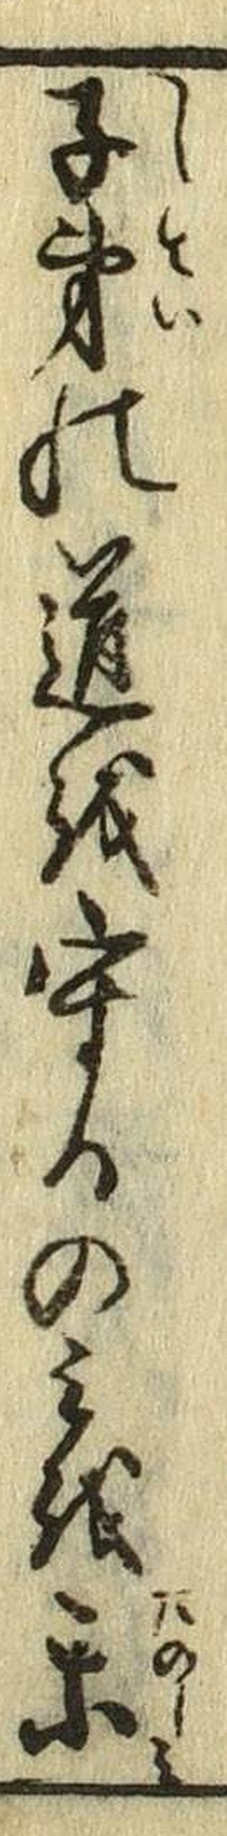子弟の道を守るのみを楽
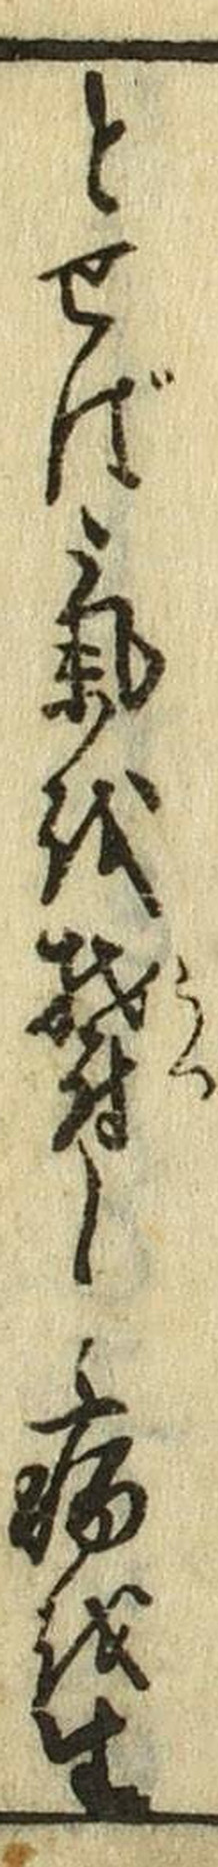とせば気を鬱し病を生
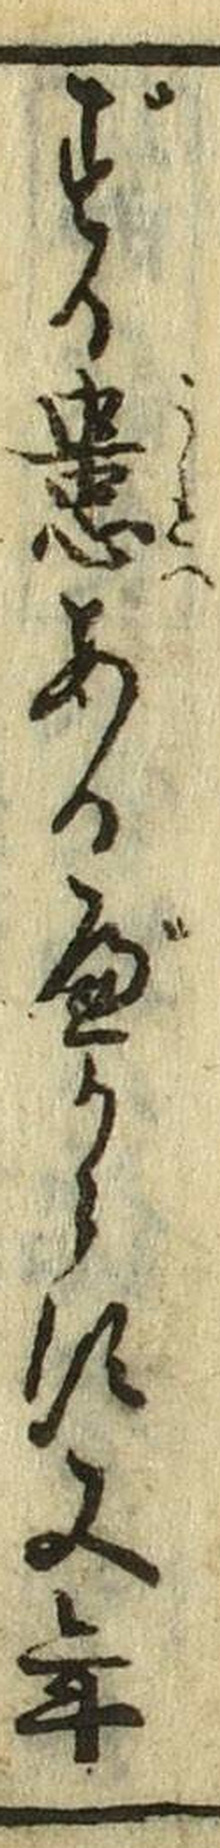ずる患あるべからす又年
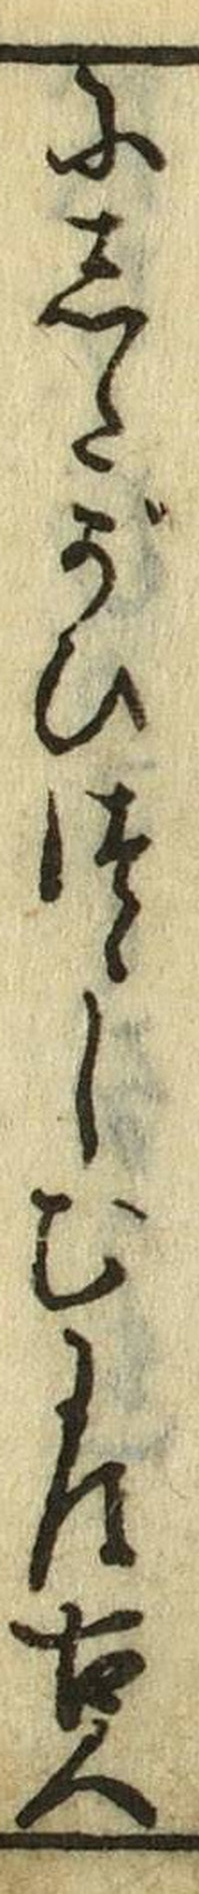にしたがひつゝしむには古人
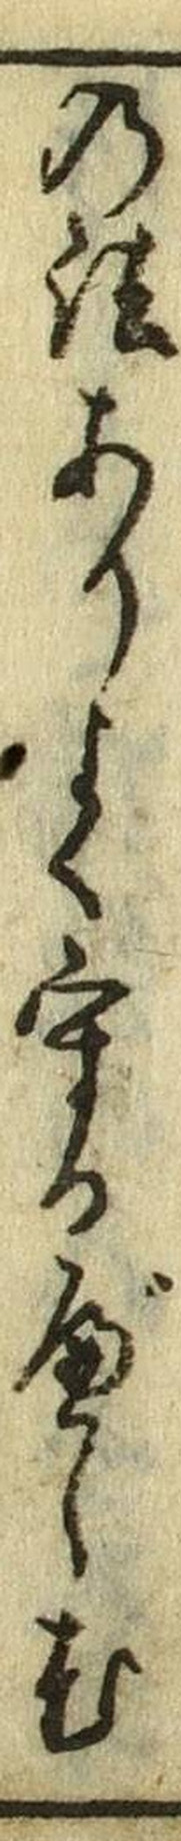の法ありよく守るべし尤
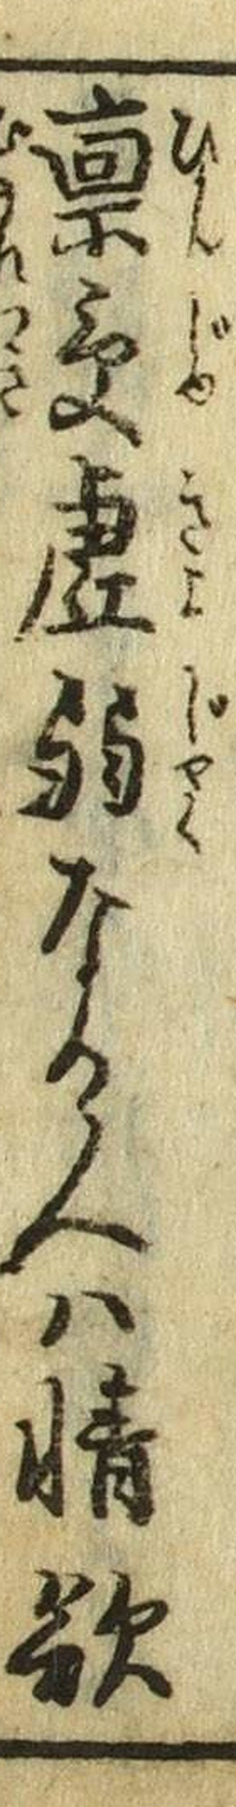稟受虚弱なる人は情欲
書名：居家養生記
